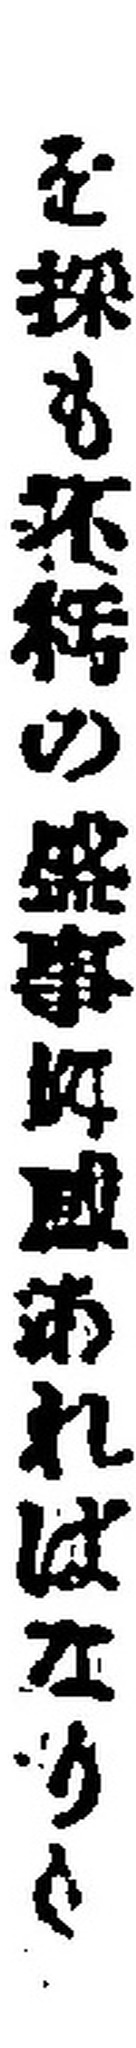を採も不𣏓の盛事に感あればなり
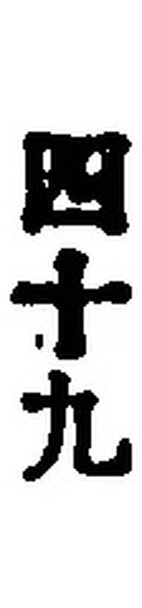四十九

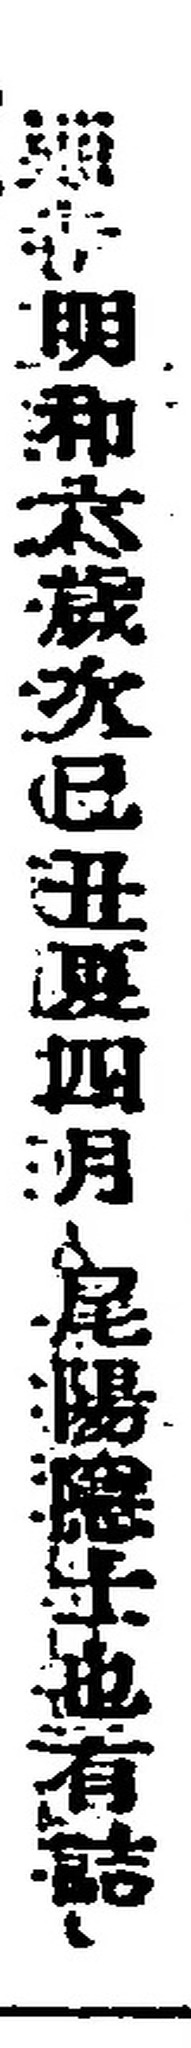明和六歳次己丑夏四月尾陽隠士也有誌
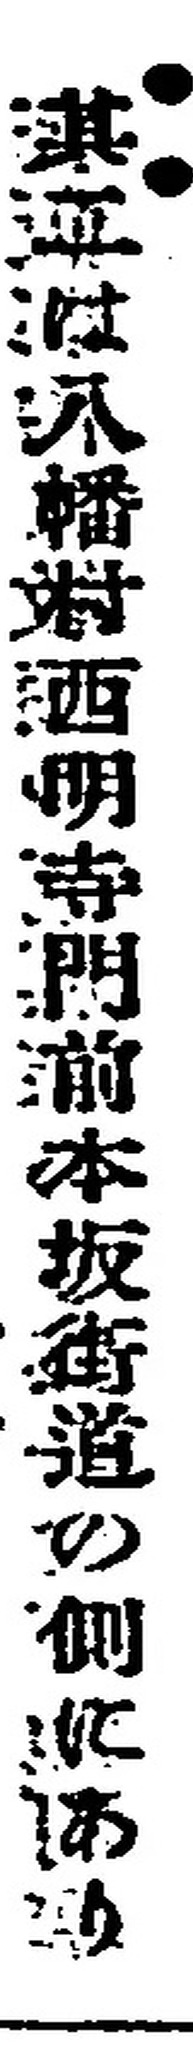其二は八幡村西明寺門前本坂街道の側にあり
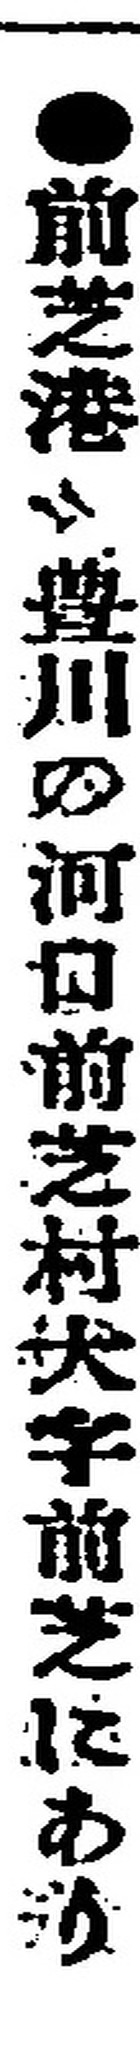●前芝港豊川の河口前芝村大字前芝にあり
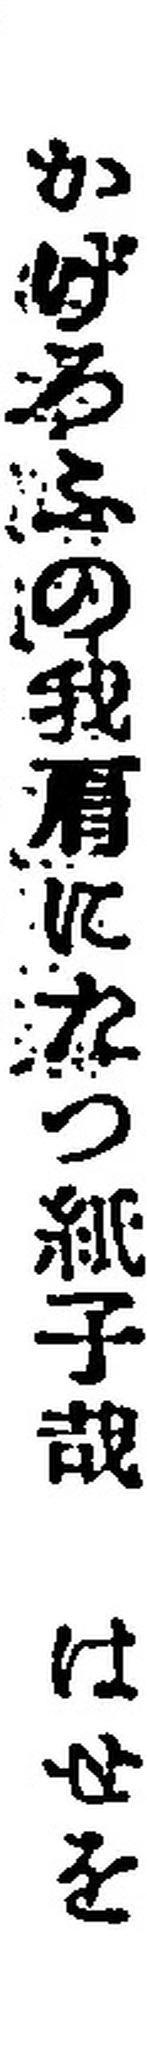かげろふの我肩にたつ紙子哉はせを
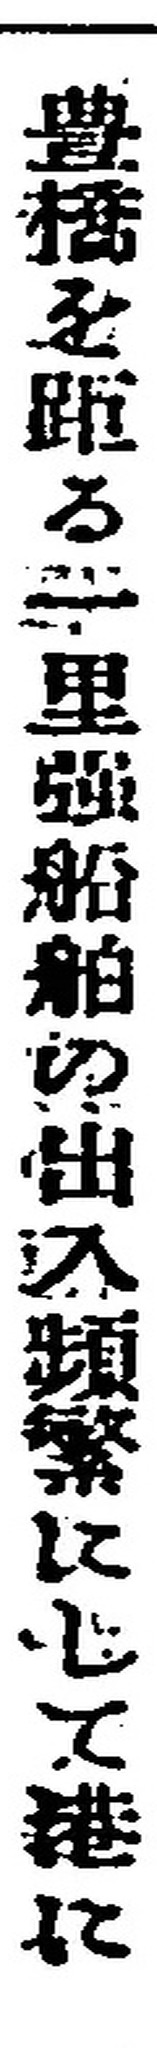豊橋を距る一里強船舶の出入頻繁にして港に
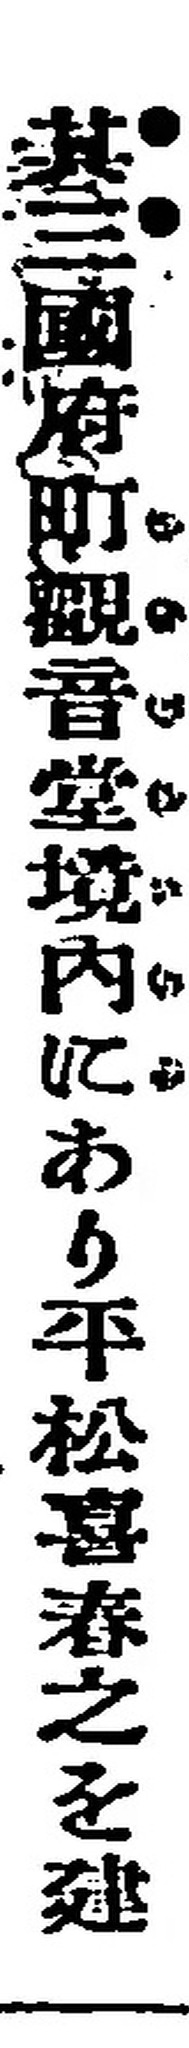其三国府町観音堂境内にあり平松喜春之を建
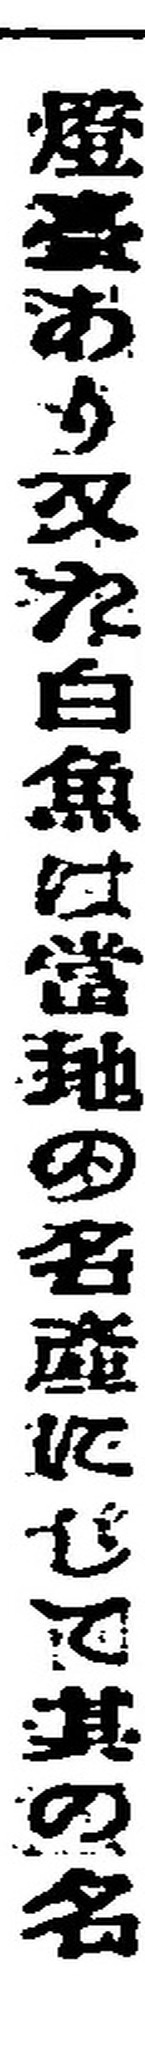燈台あり又た白魚は当地の名産にして其の名
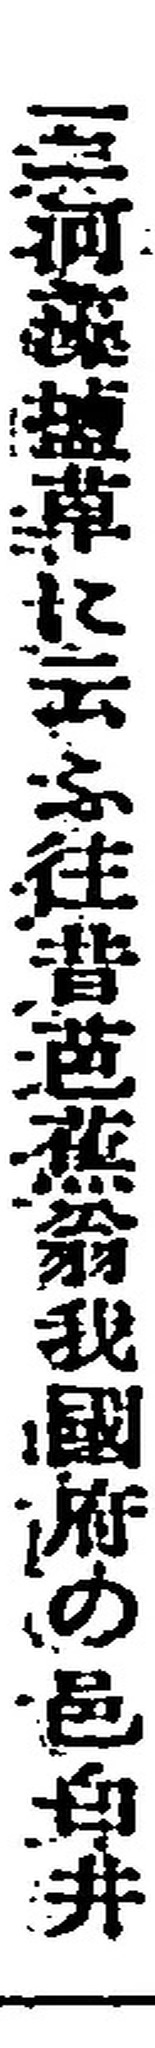三河藻塩草に云ふ往昔芭蕉翁我国府の邑白井
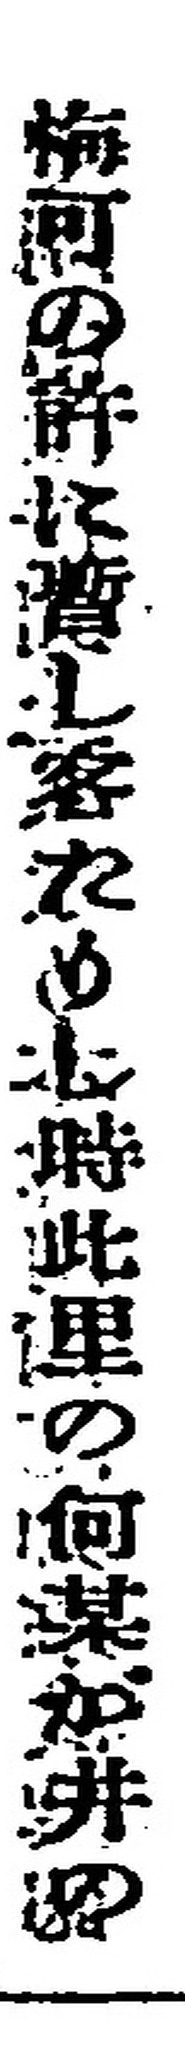梅可の許に暫し客たりし時此里の何某が井の
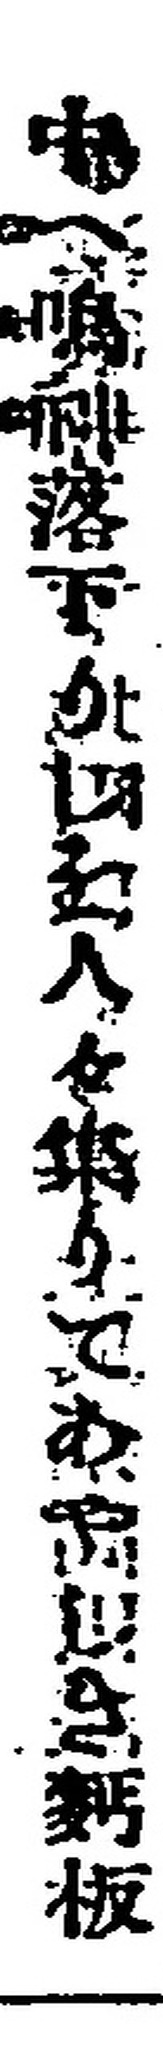中へ鳴神落下りしを人々集りてあやしき麫板
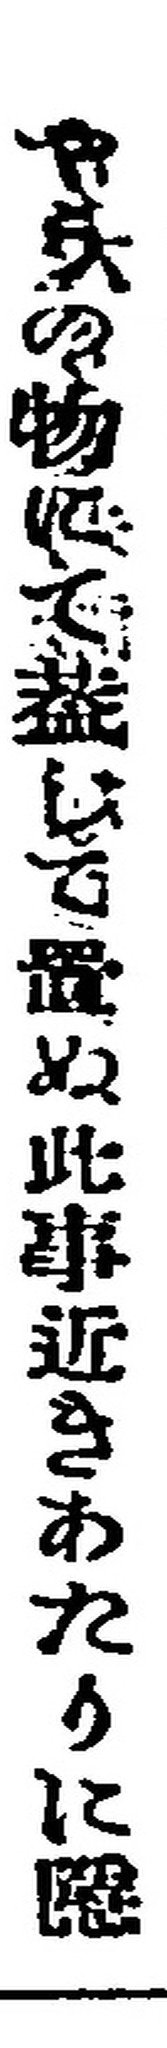ようの物にて葢して置ぬ此事近きあたりに隠
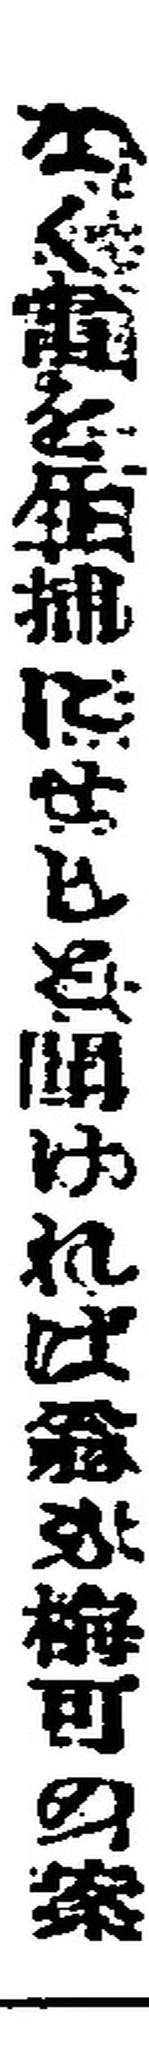なく雷を生捕にせしと聞ければ翁が梅可の案
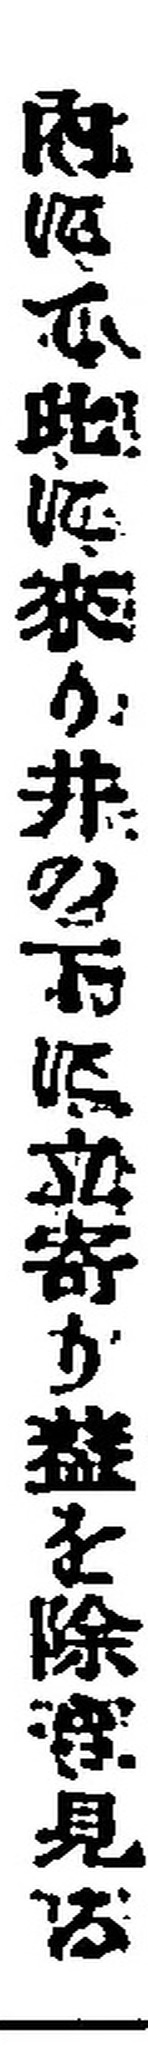内にて此に来り井の下に立寄り葢を除き見る
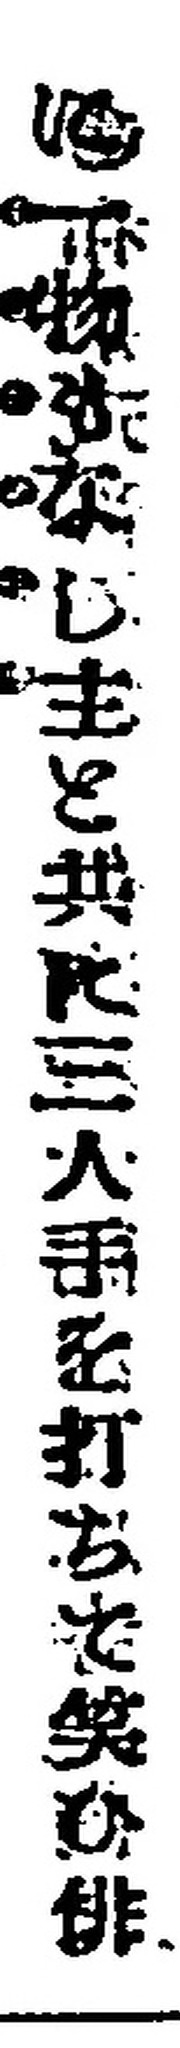に一物もなし主と共に三人手を打ちて笑ひ俳
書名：東参名勝案内
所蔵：国立国会図書館 National Diet Library, JAPAN
